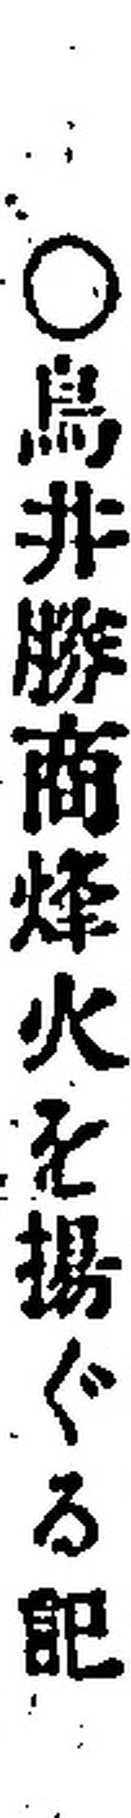○鳥井勝商烽火を揚ぐる記
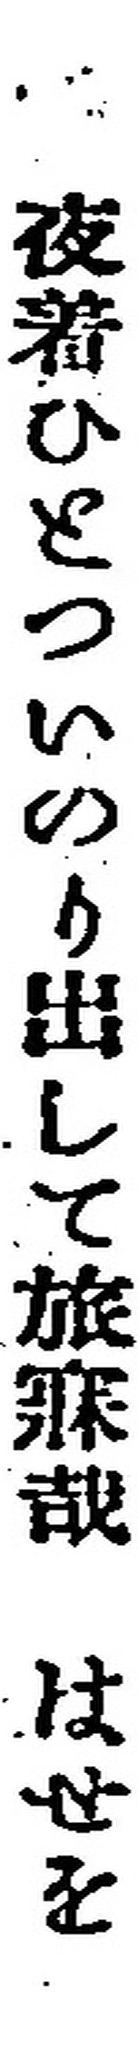夜着ひとついのり出して旅寐哉はせを
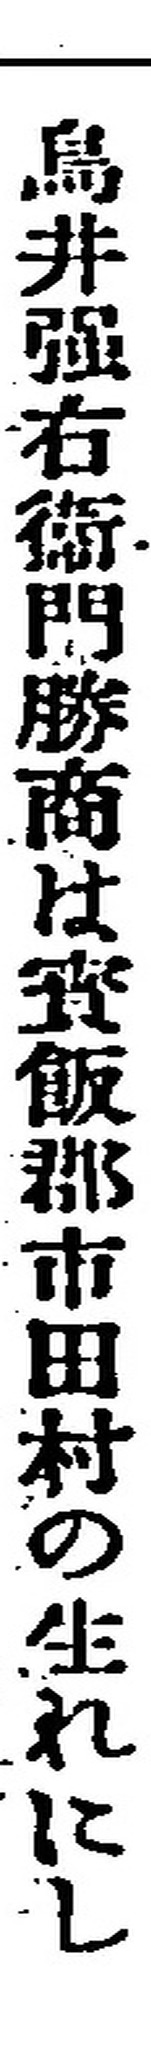鳥井強右衛門勝商は宝飯郡市田村の生れにし
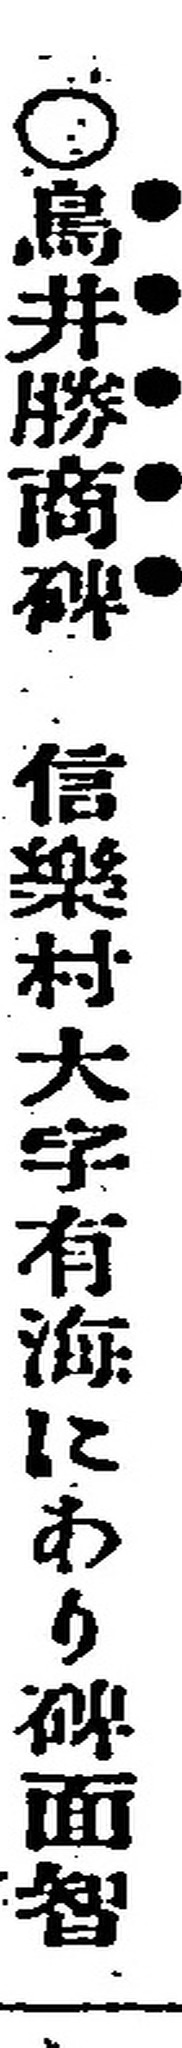○鳥井勝商碑信楽村大字有海にあり碑面智
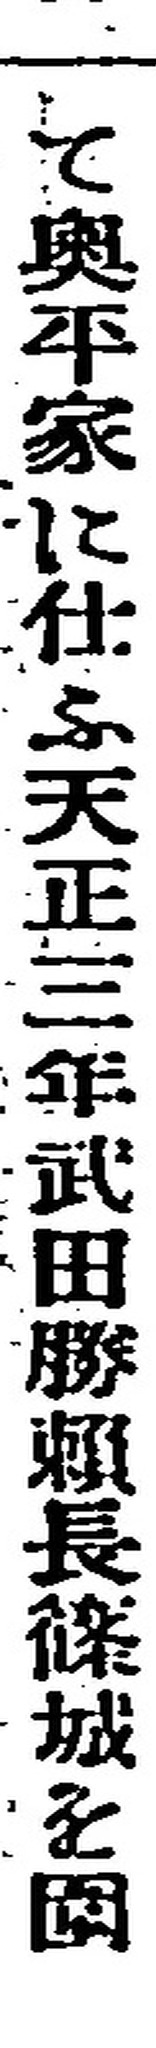て奥平家に仕ふ天正三年武田勝頼長篠城を囲
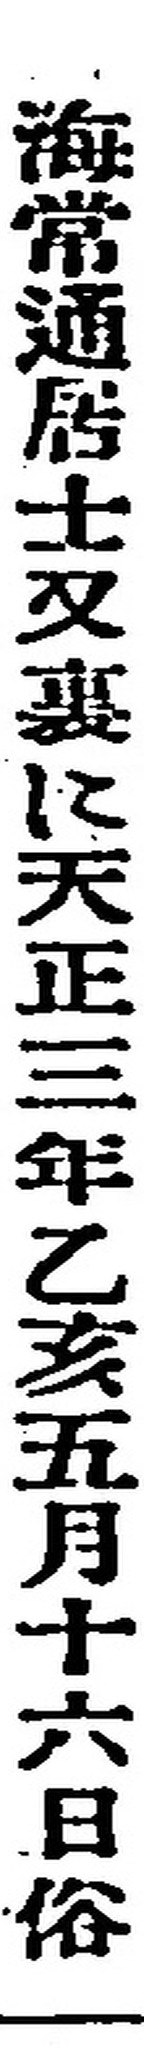海常通居士又裏に天正三年乙亥五月十六日俗
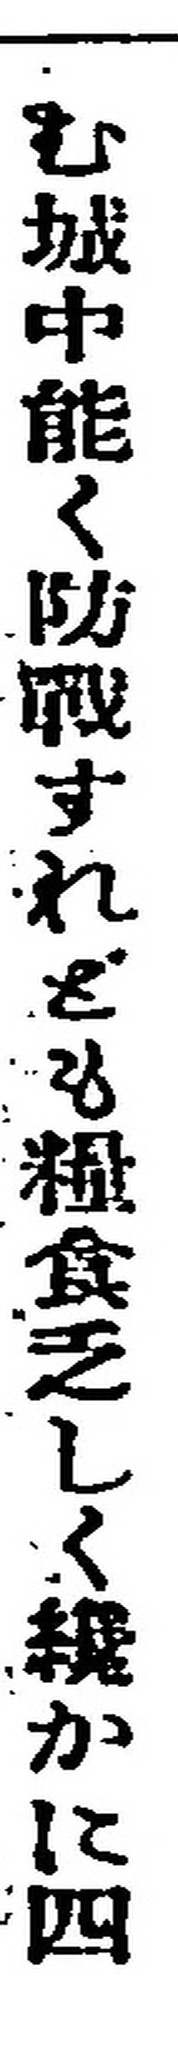む城中能く防戦すれども糧食乏しく纔かに四
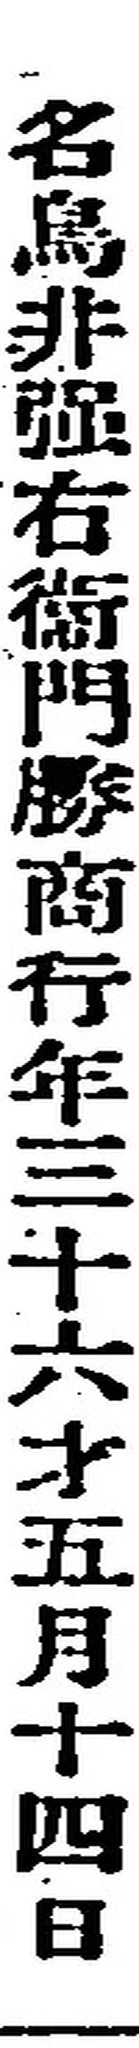名鳥井強右衛門勝商行年三十六才五月十四日
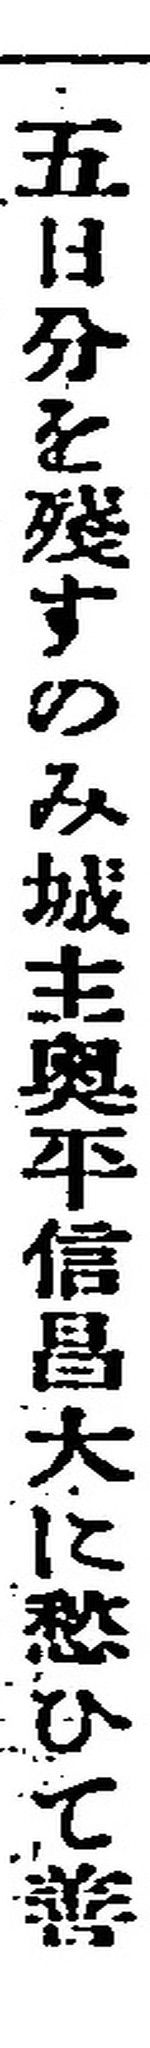五日分を残すのみ城主奥平信昌大に愁ひて善
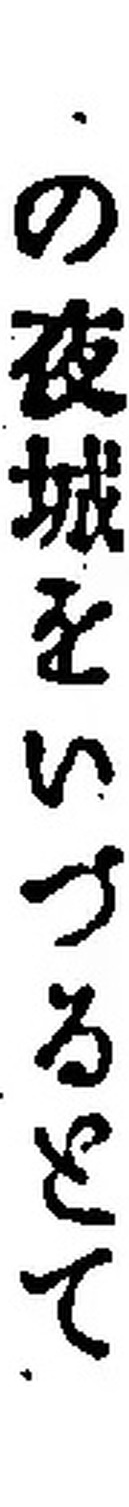の夜城をいづるとて
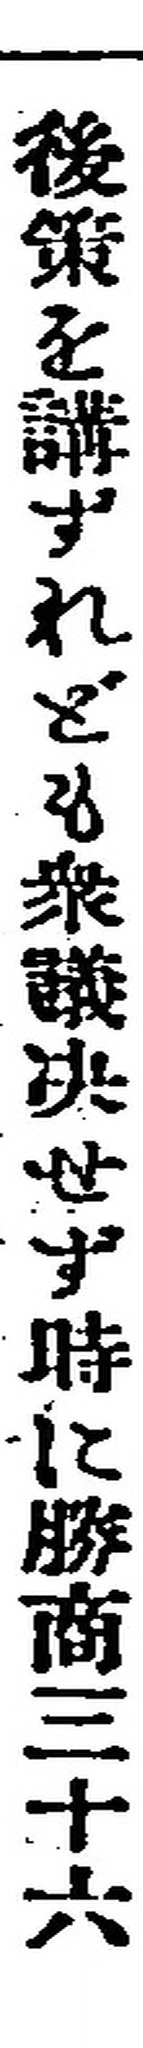後策を講ずれども衆議決せず時に勝商三十六
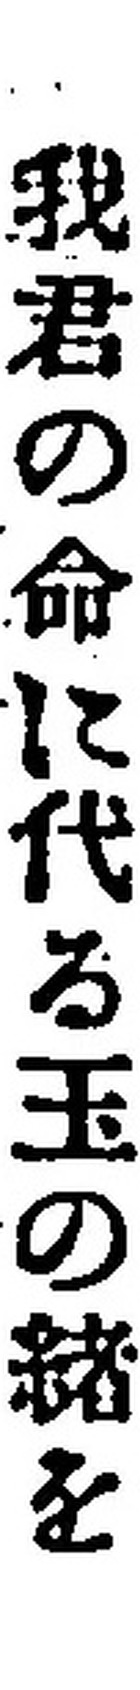我君の命に代る玉の緒を
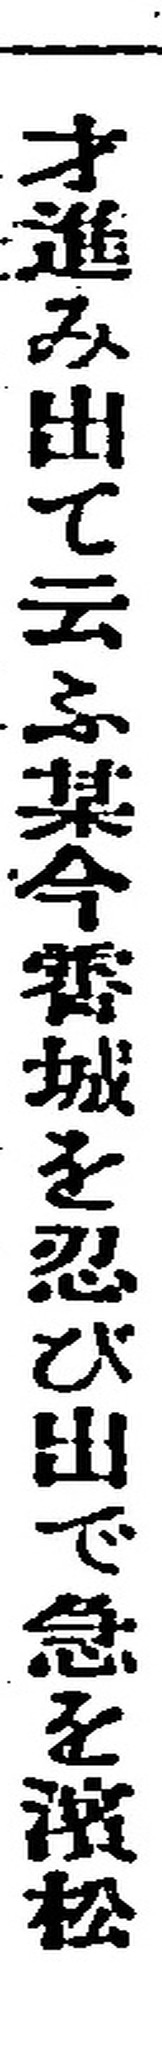才進み出て云ふ某今霄城を忍び出で急を浜松
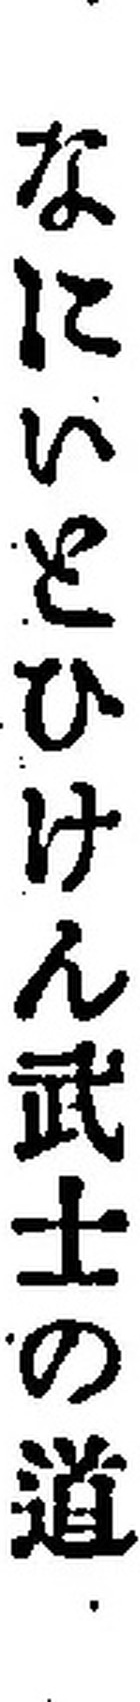なにいとひけん武士の道
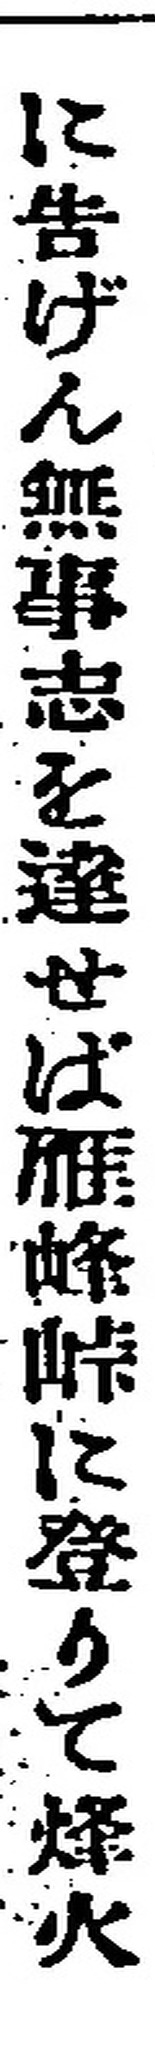に告げん無事志を達せば雁峰峠に登りて烽火
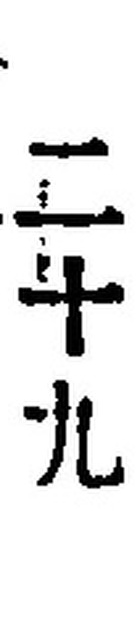二十九
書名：東参名勝案内
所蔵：国立国会図書館 National Diet Library, JAPAN
